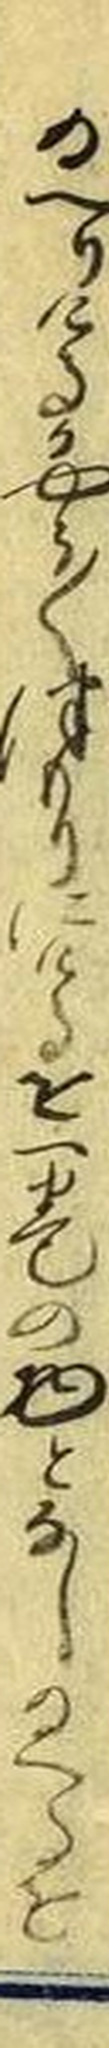給へりけるかやう〳〵つもりにけるを一巻の物となし給へるを
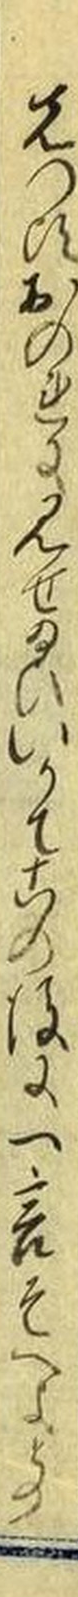先つ頃おのれに見せ給ひいかてこの後に一言そへよとの
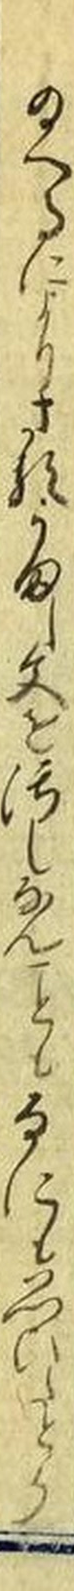給へるによりさるうまし文を汚しなんこともなにも思ひたとう
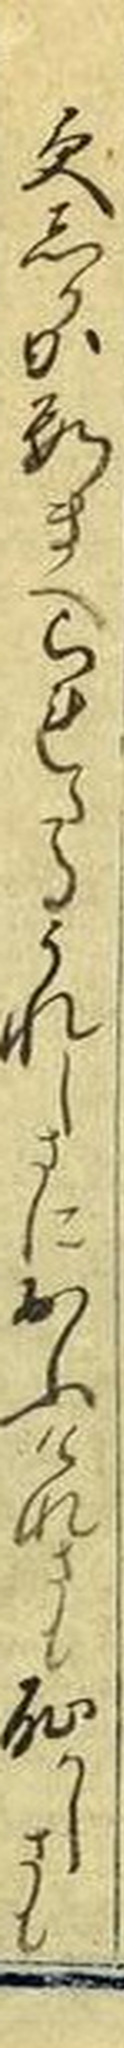受しかかすまえられたるうれしさにおふけなさも恥かしさも
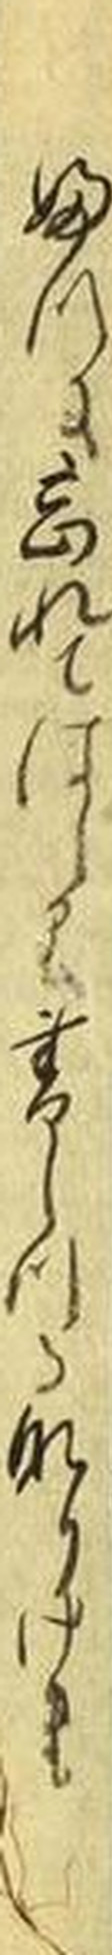ふつに忘れてはしり書しつるなりけり
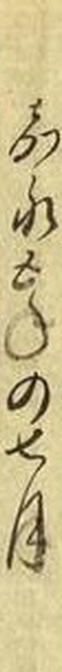嘉永五年の七月

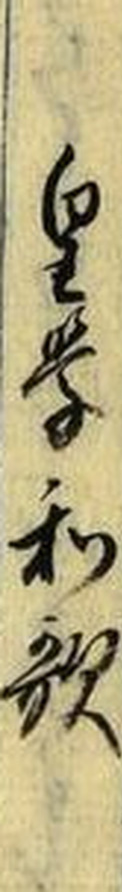皇学和歌
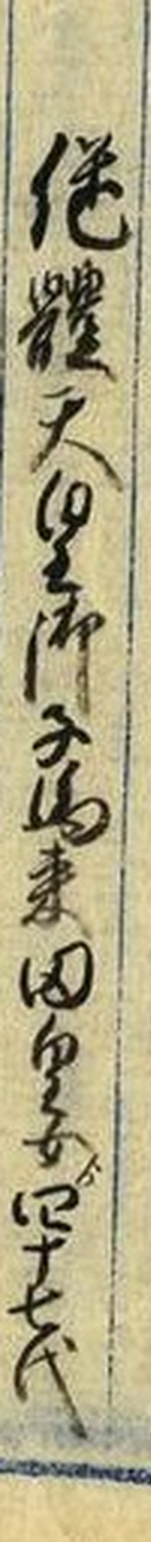継軆天皇御子馬来田皇女ゟ四十七代
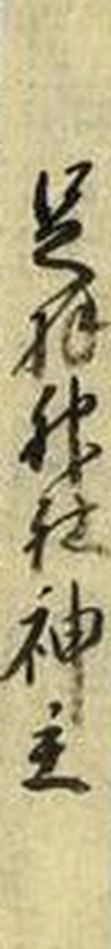足羽神社神主
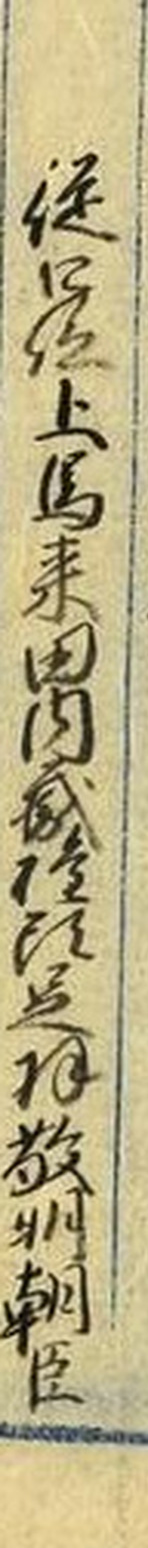従四位上馬来田内蔵権頭足羽敬明朝臣
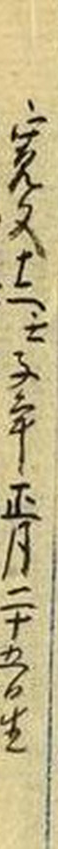寛政十二壬子年正月二十五日生
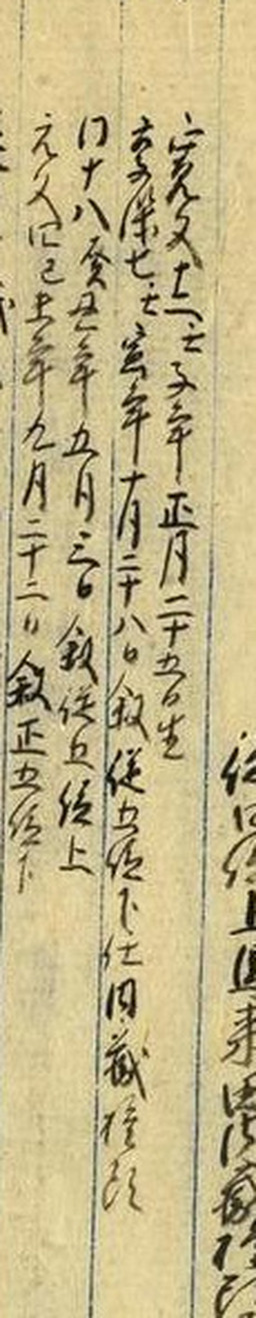享保七壬寅年十月二十八日叙従五位下任内蔵権頭
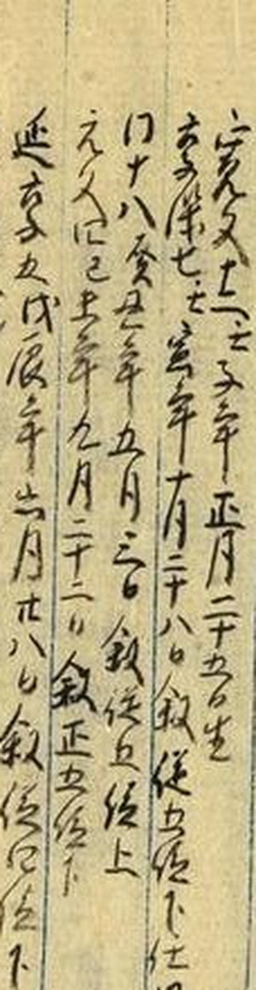同十八癸丑年五月三日叙従五位上
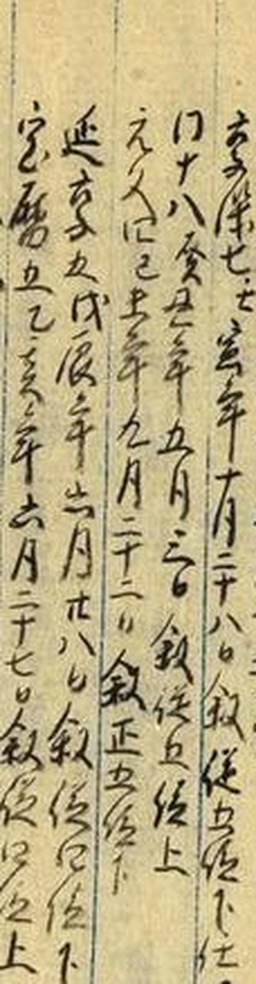元文四己未年九月二十二日叙正五位下
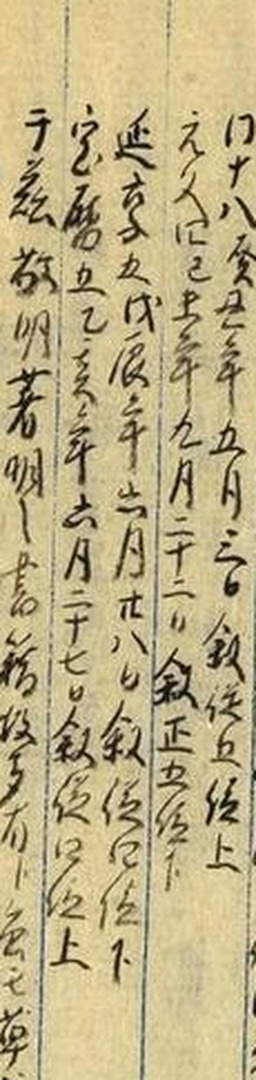延享五戊辰年六月廿八日叙従四位下
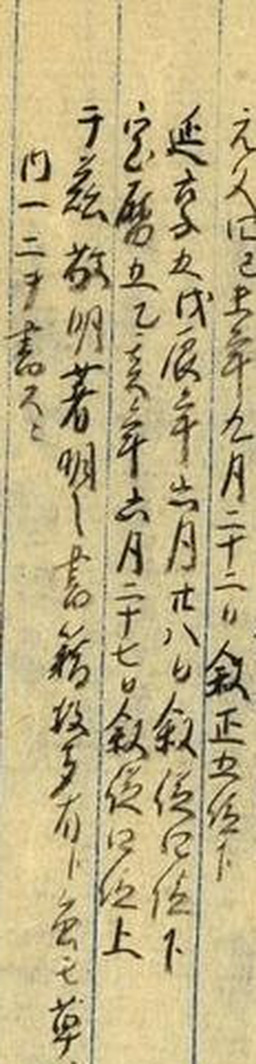宝暦五乙亥年六月二十七日叙従四位上
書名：温古集 三巻
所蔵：福井県文書館 Fukui Prefectural Archives
